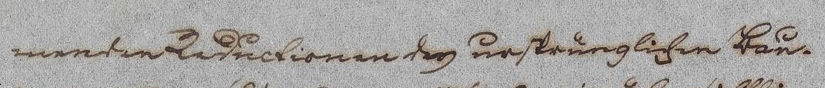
menden Reductionen des ursprünglichen Bau-
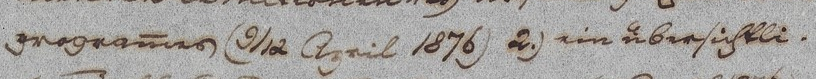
programmes (9/12 April 1876), 2.) ein übersichtli-
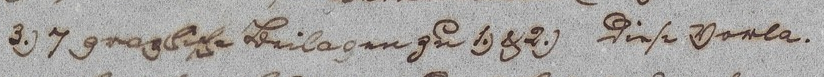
3.) 7 graphische Beilagen zu 1.) & 2.). Diese Vorla-
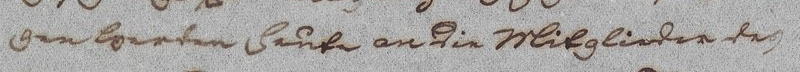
gen werden heute an die Mitglieder des
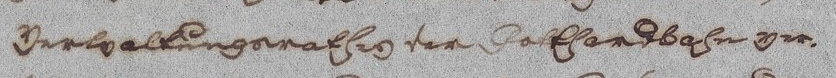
Verwaltungsrathes der Gotthardbahn ver-
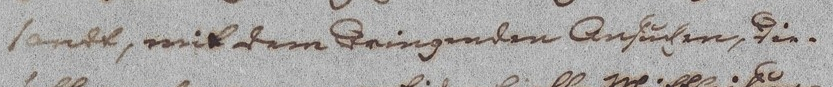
sandt, mit dem dringenden Ansuchen, die-
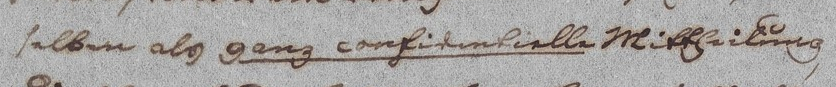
selben als ganz confidentielle Mittheilung,
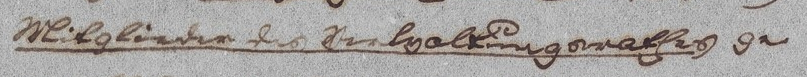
Mitglieder des Verwaltungsrathes ge-
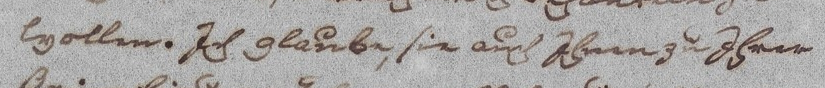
wollen. Ich glaube, sie auch Ihnen zu Ihrer
